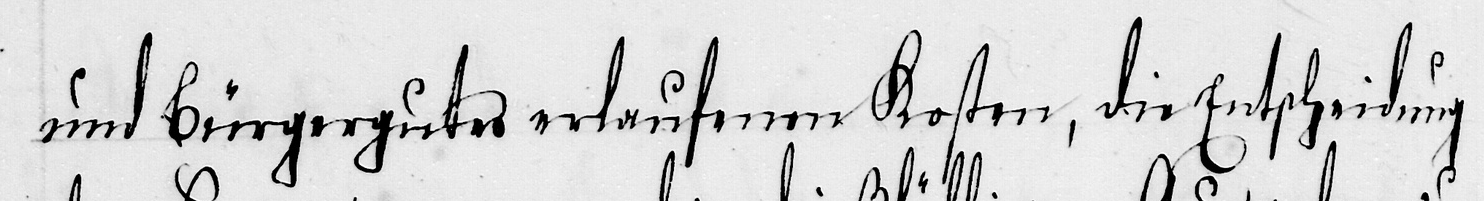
und Bürgergutes verlaufenen Kosten, die Entscheidung
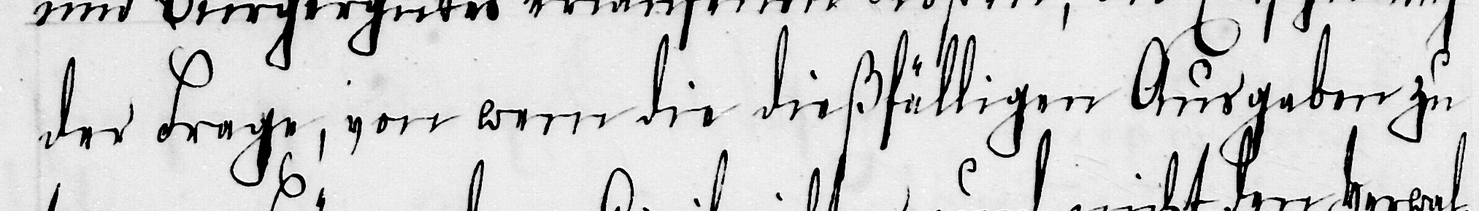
der Frage, von wem die dießfälligen Ausgaben zu
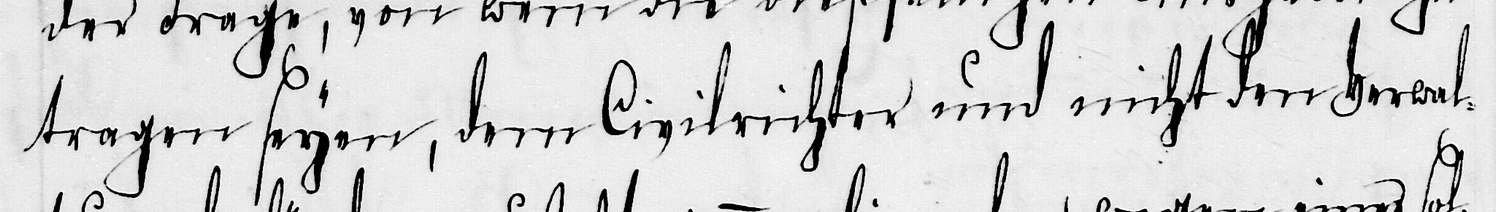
tragen seyen, dem Civilrichter und nicht den Verwal¬
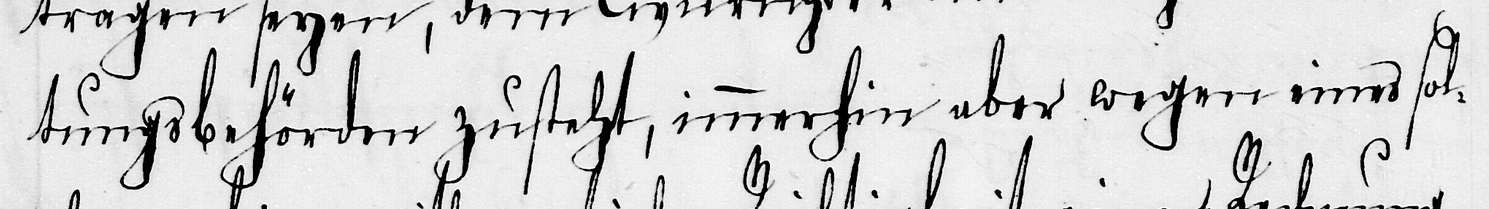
tungsbehörden zusteht, immerhin aber wegen eines so¬
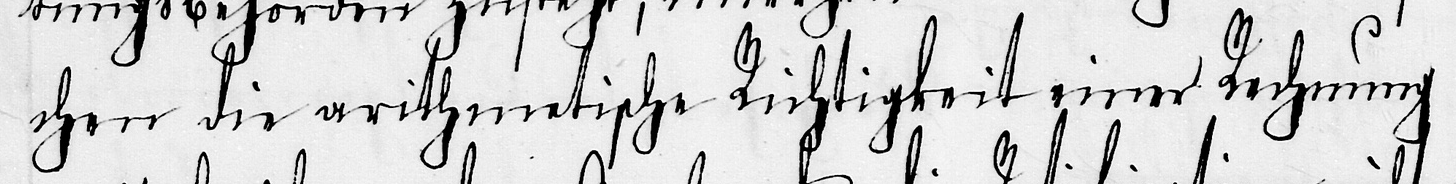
lchen die arithmetische Richtigkeit einer Rechnung
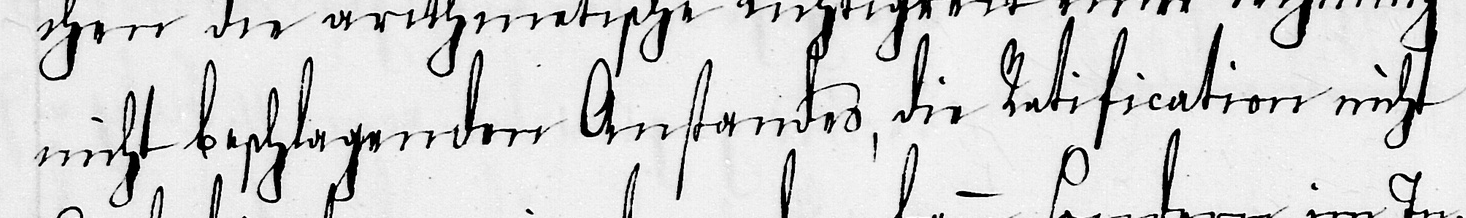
nicht beschlagenden Anstandes, die Ratification nicht
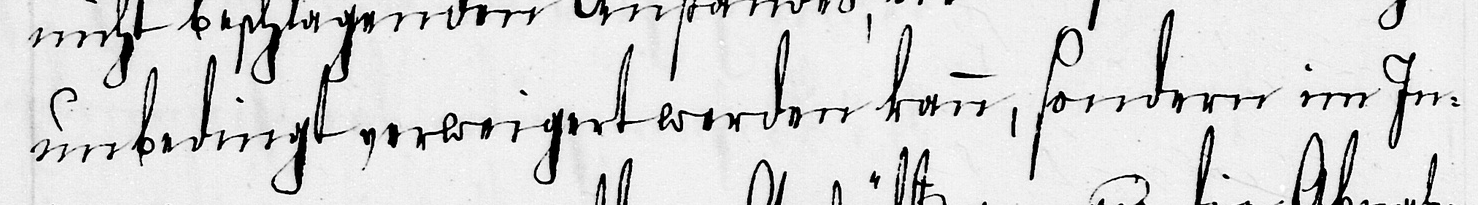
unbedingt verweigert werden kann, sondern im In¬
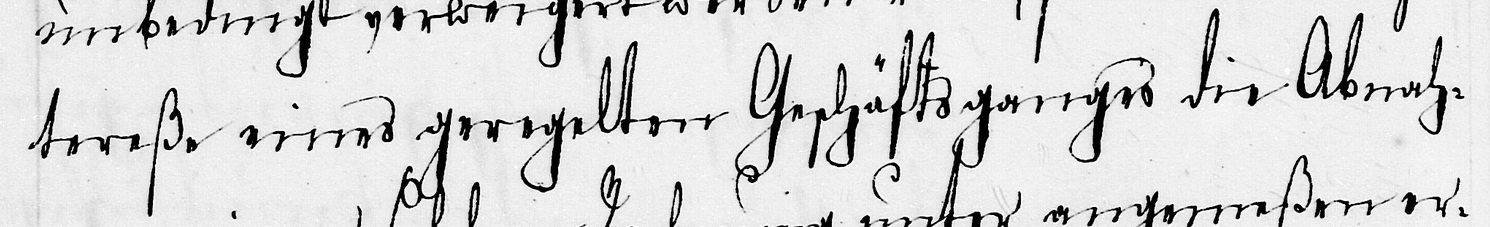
tereße eines geregelten Geschäftsganges die Abnah¬
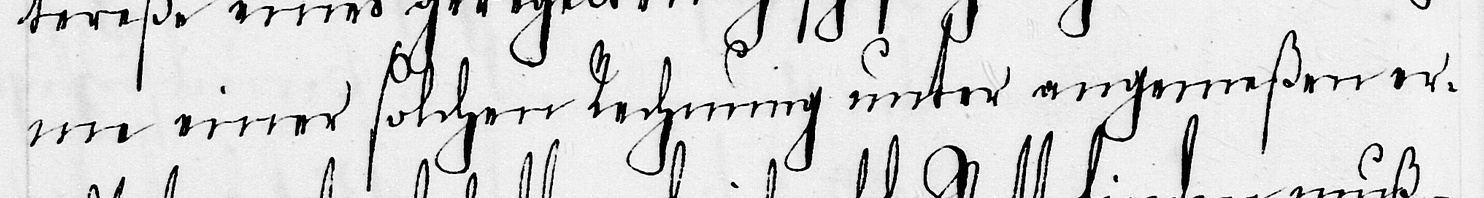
me einer solchen Rechnung unter angemeßen er¬
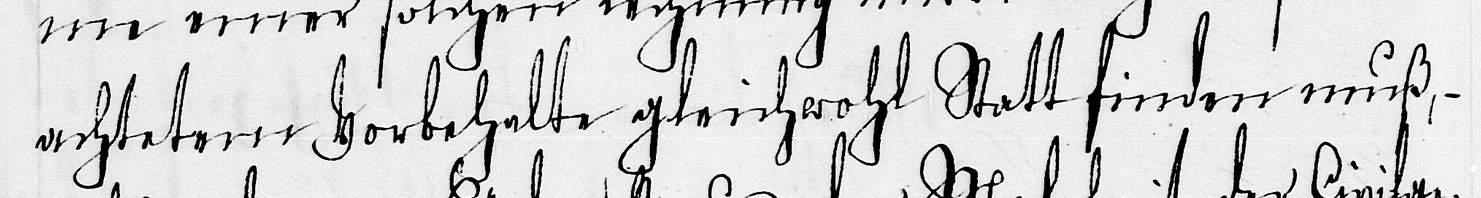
achtetem Vorbehalte gleichwohl Statt finden muß,
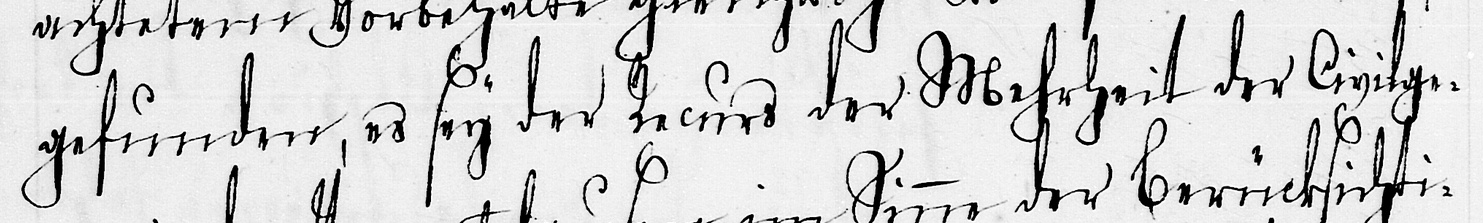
gefunden, es sey der Recurs der Mehrheit der Civilge¬
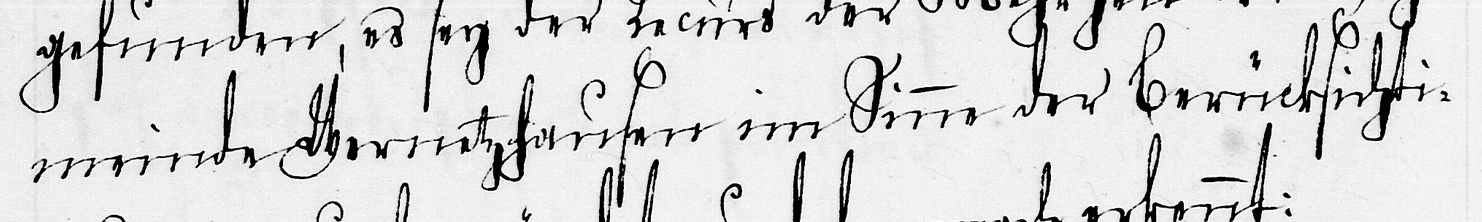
meinde Wernetzhausen im Sinne der Berücksichti¬
